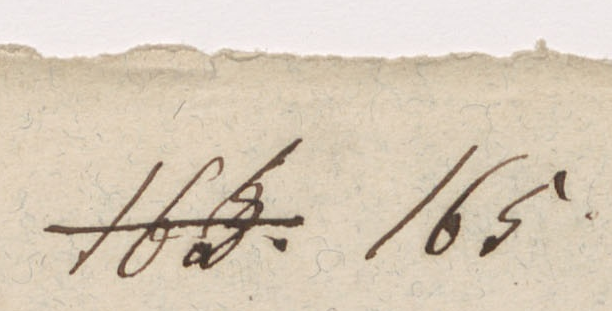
165. 165.
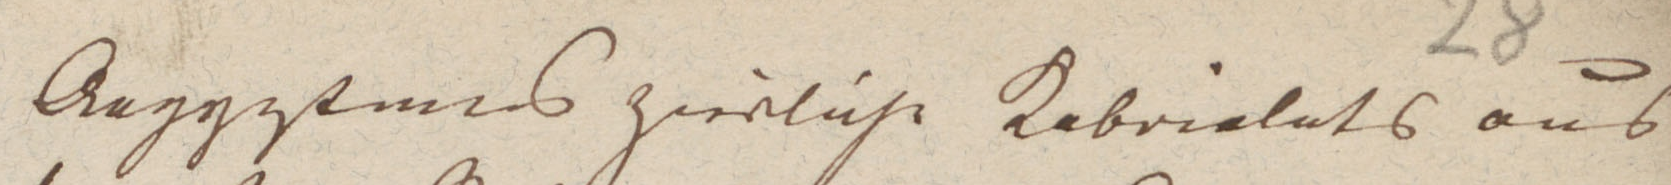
Aegyptens zierliche Kabriolets aus
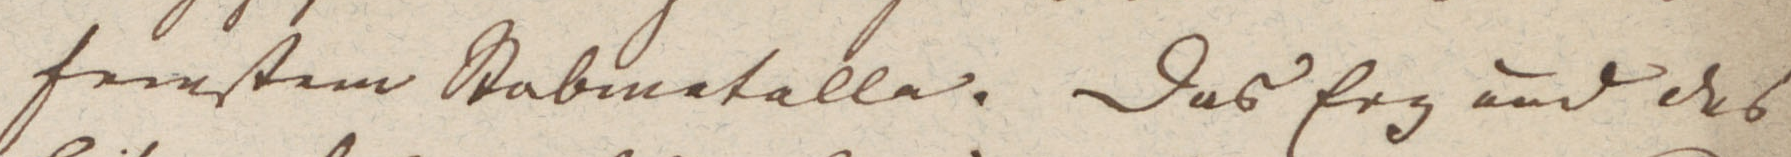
feinstem Stabmetalle. Das Erz und das
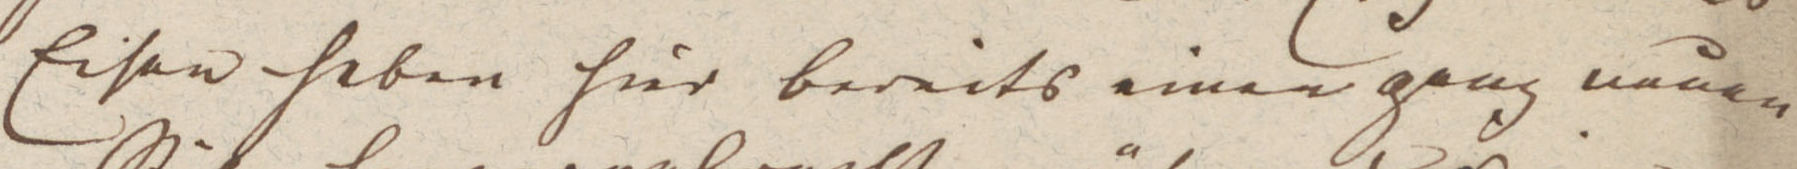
Eisen haben hier bereits einen ganz neuen
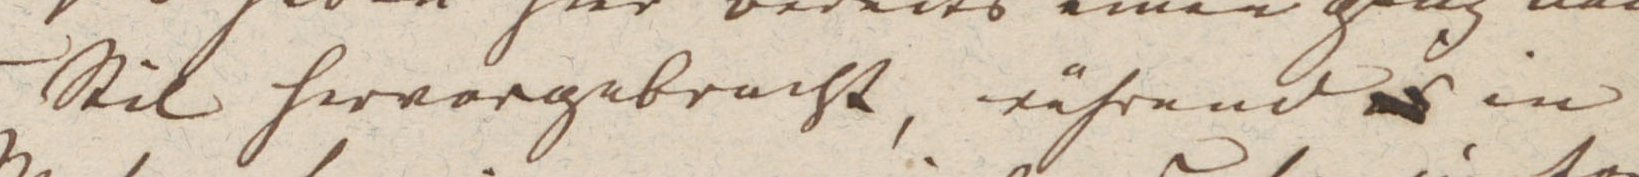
Stil hervorgebracht, während es in
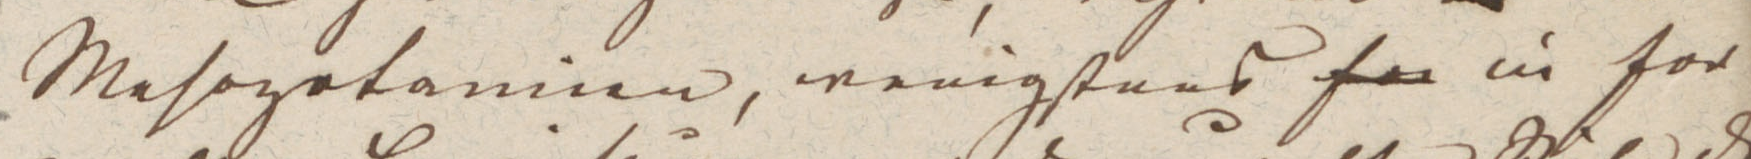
Mesopotamien, wenigstens fo in for-
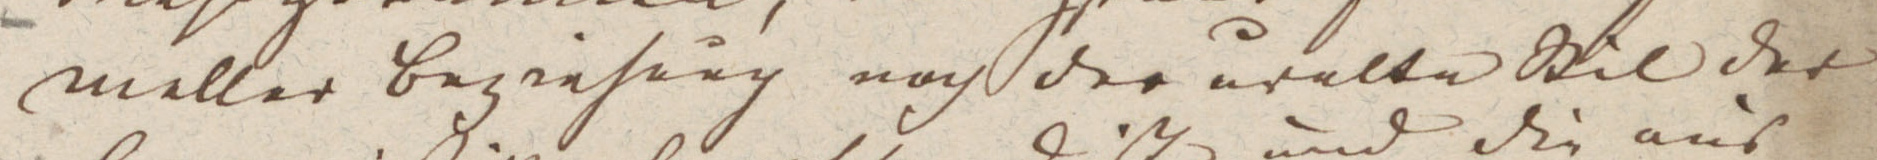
meller Beziehung noch der uralte Stil der
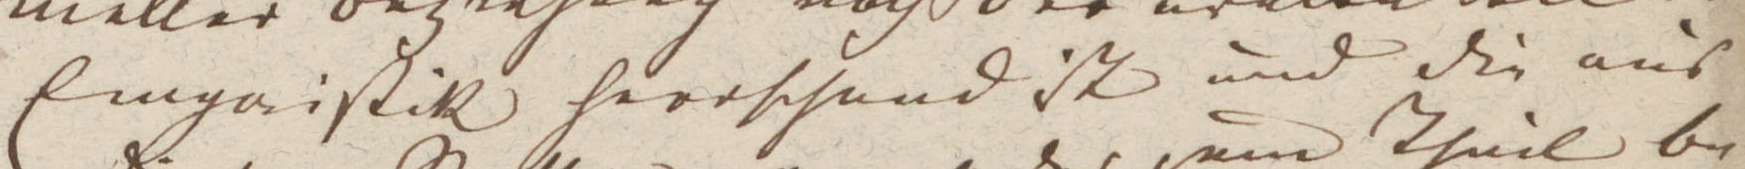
Empaistik herrschend ist und die aus
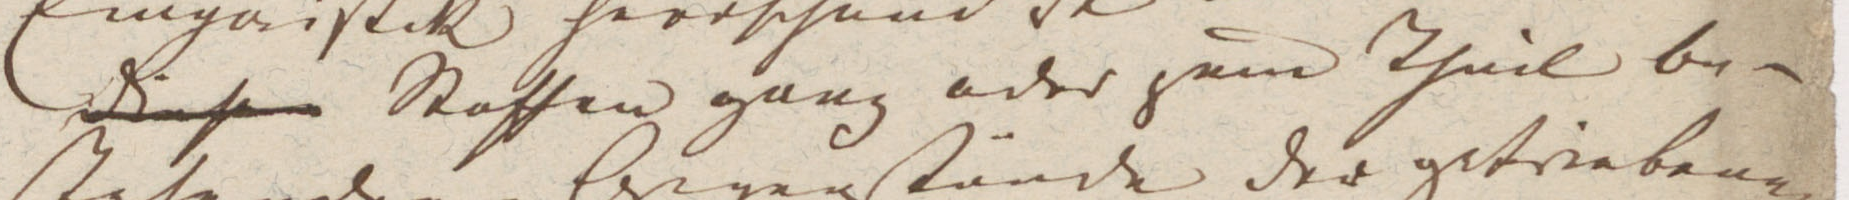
diesen Stoffen ganz oder zum Theil be-
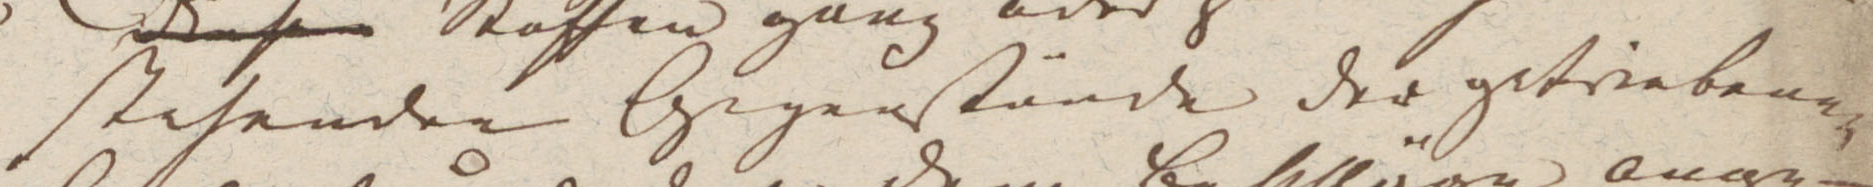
stehenden Gegenstände der getriebenen
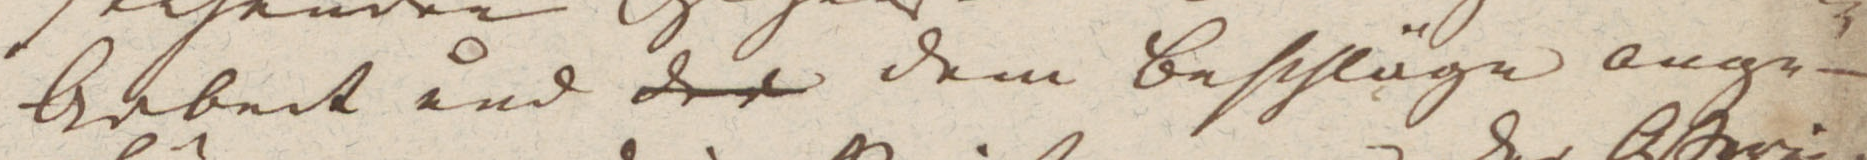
Arbeit und der dem Beschläge ange-
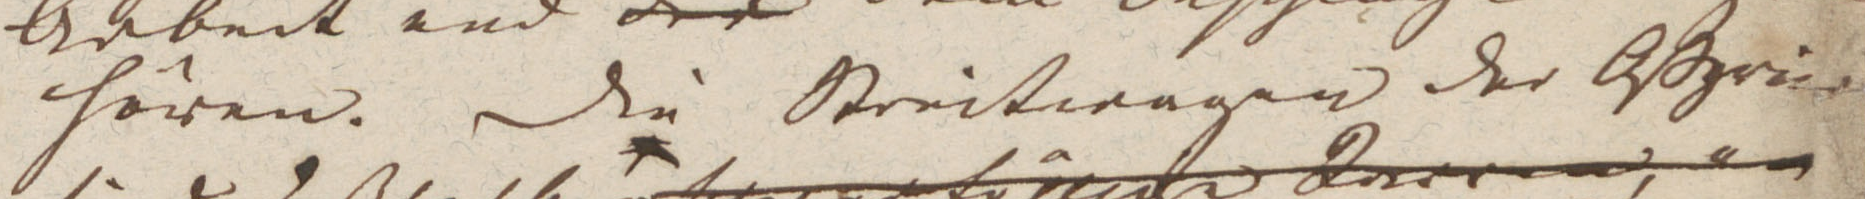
hören. Die Streitwagen der Assyrier
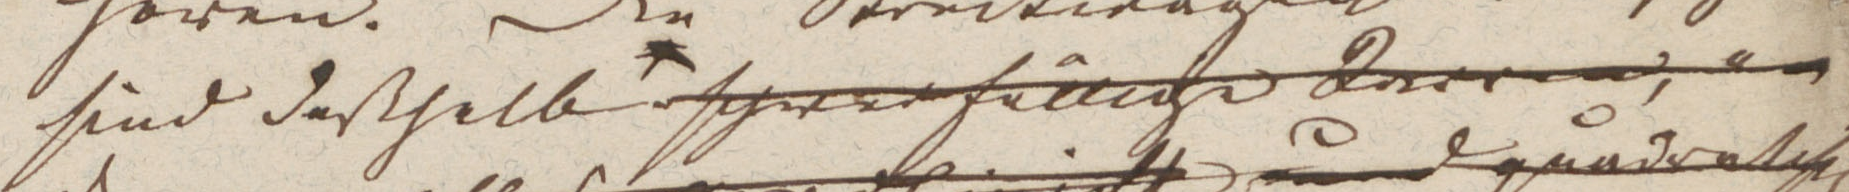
sind desshalb % schwerfällige Karren, an
